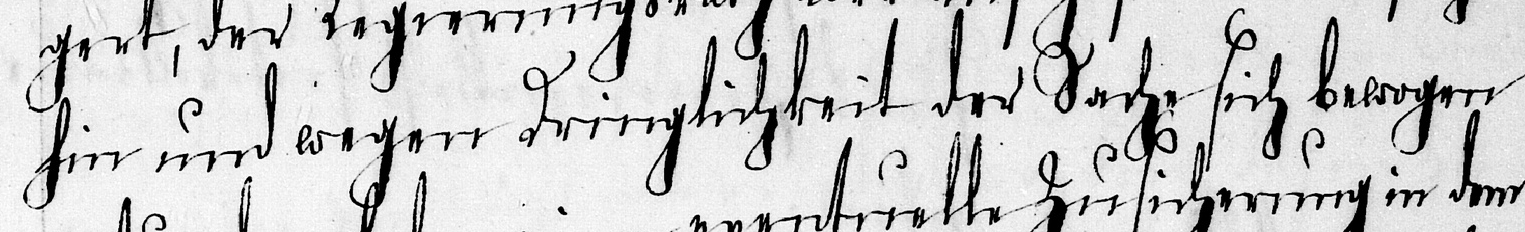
hin und wegen Dringlichkeit der Sache sich bewogen
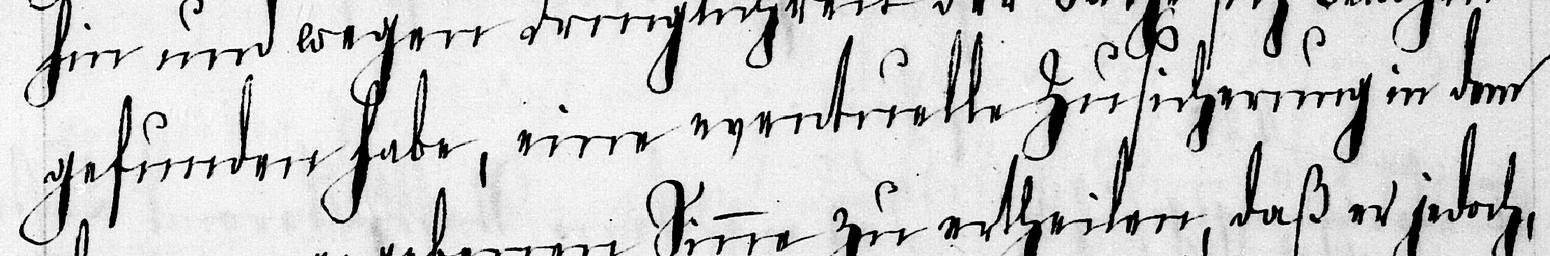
gefunden habe, eine eventuelle Zusicherung in dem
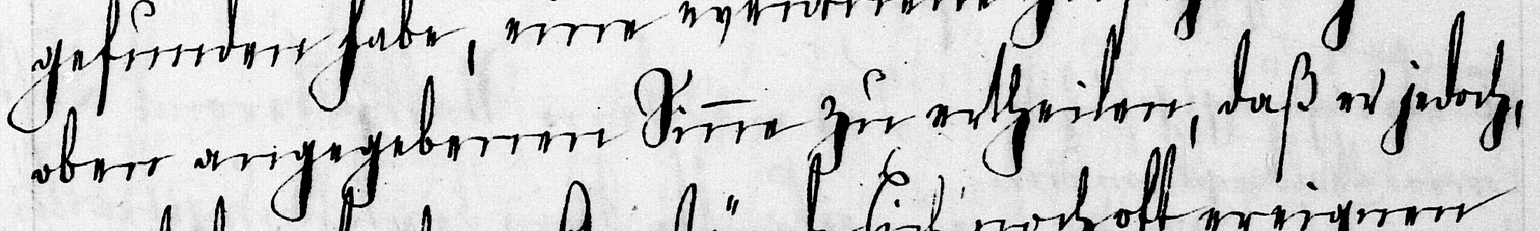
oben angegebenen Sinne zu ertheilen, daß er jedoch,
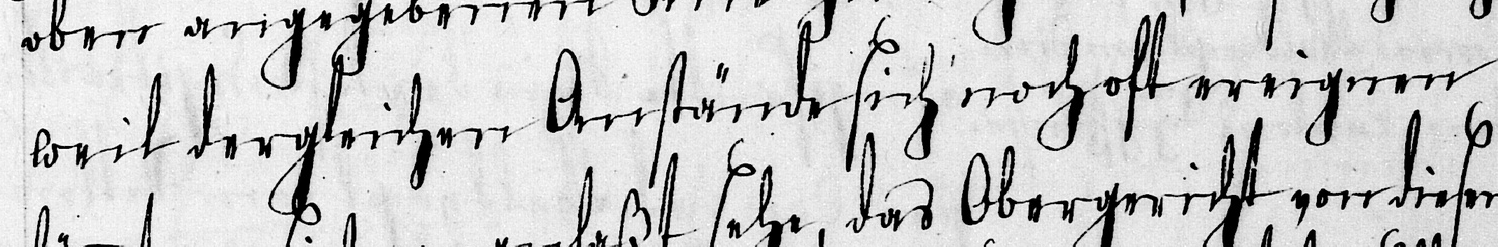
weil dergleichen Anstände sich noch oft ereignen
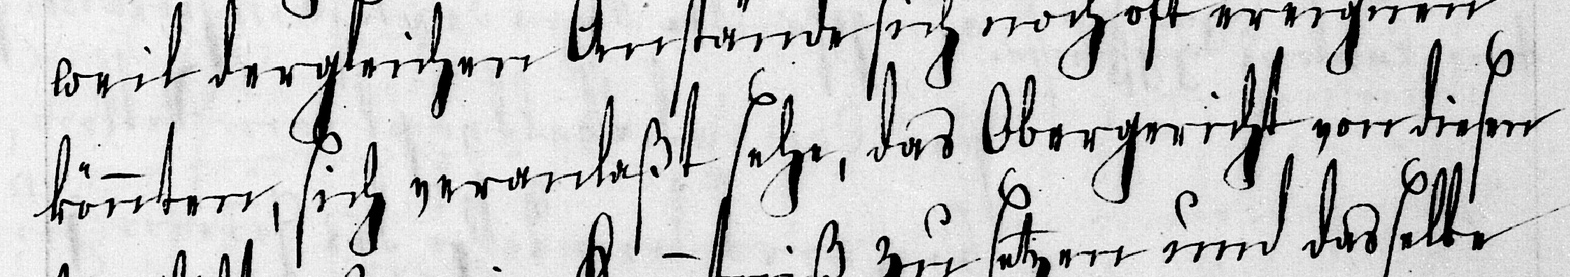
könnten, sich veranlaßt sehe, das Obergericht von diesen
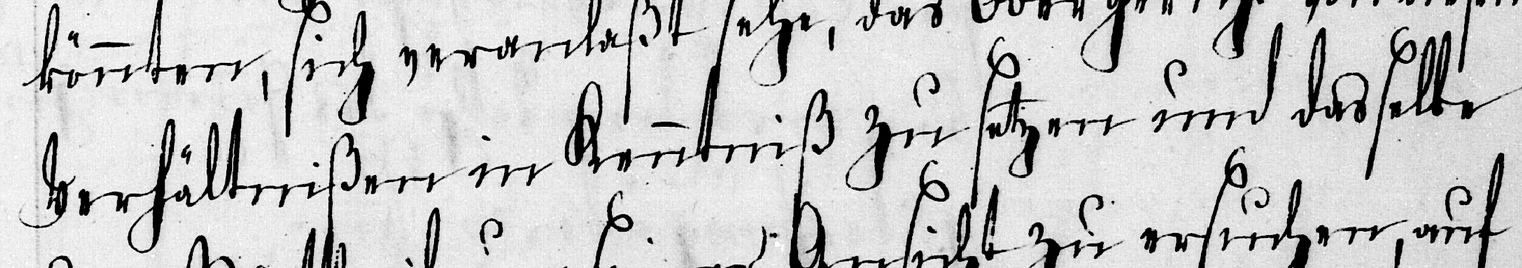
Verhältnißen in Kenntniß zu setzen und dasselbe
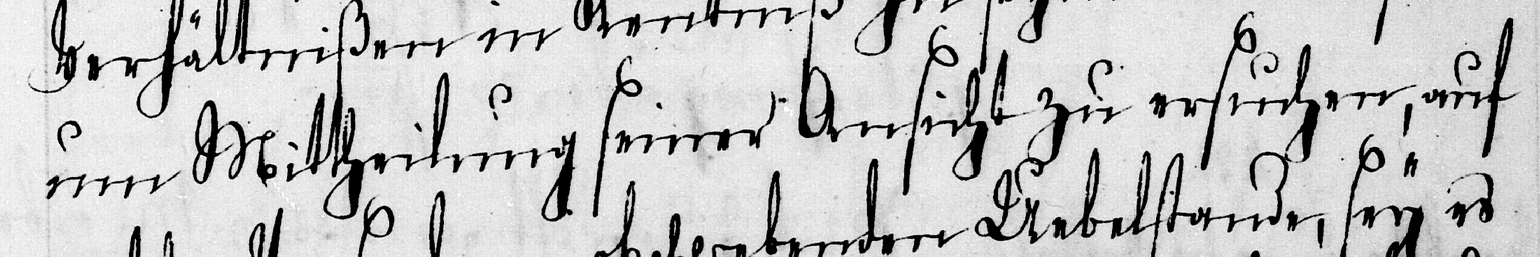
um Mittheilung seiner Ansicht zu ersuchen, auf
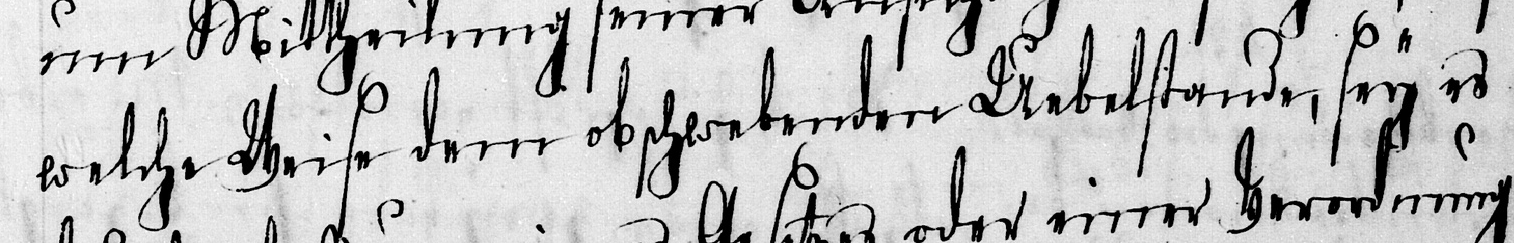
welche Weise dem obschwebenden Uebelstande, sey es
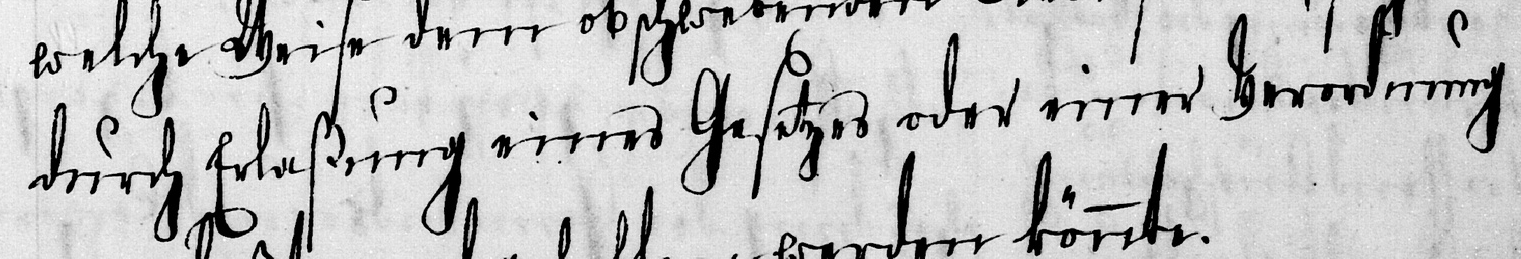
durch Erlaßung eines Gesetzes oder einer Verordnung
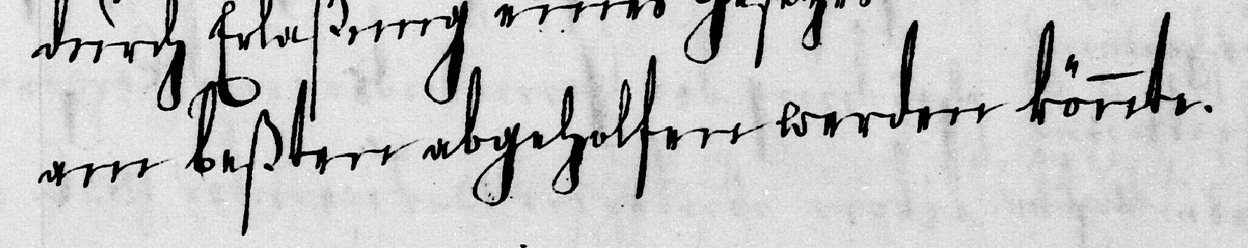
am beßten abgeholfen werden könnte.
